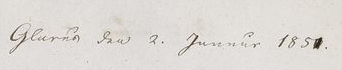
Glarus den 2. Januar 18501.
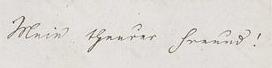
Mein theurer Freund!
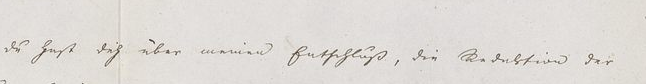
Du hast Dich über meinen Entschluß, die Redaktion der
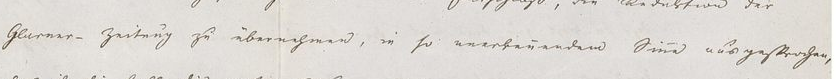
Glarner-Zeitung zu übernehmen, in so anerkennendem Sinne ausgesprochen,
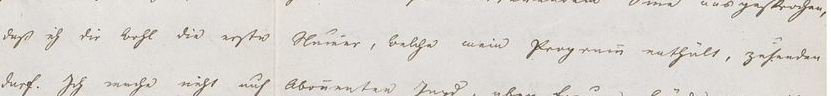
daß ich Dir wohl die erste Nummer, welche mein Programm enthält, zusenden
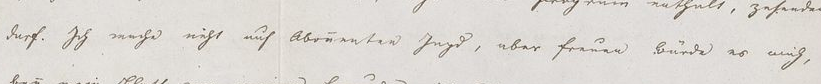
darf. Ich mache nicht auf Abonnenten Jagd, aber freuen würde es mich,
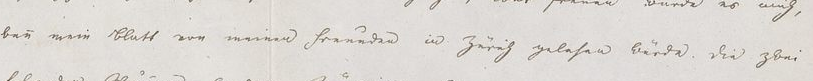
wenn mein Blatt von meinen Freunden in Zürich gelesen würde. Die zwei
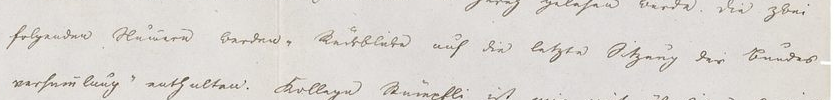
folgenden Nummern werden «Rückblicke auf die letzte Sitzung der Bundes-
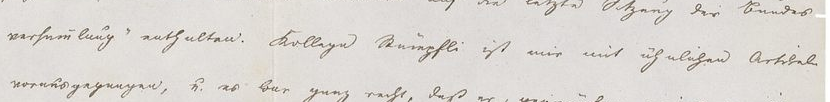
versammlung» enthalten. Kollege Stämpfli ist mir mit ähnlichen Artikeln
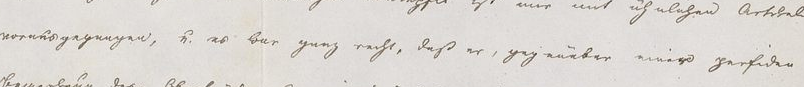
vorausgegangen, u. es war ganz recht, daß er, gegenüber einer perfiden
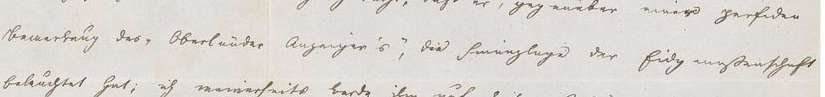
Bemerkung des «Oberländer Anzeiger's», die Finanzlage der Eidgenossenschaft
